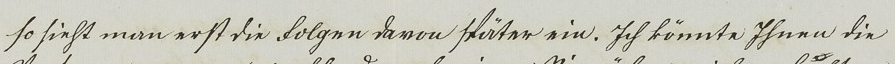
so sieht man erst die Folgen davon später ein. Ich könnte Ihnen die
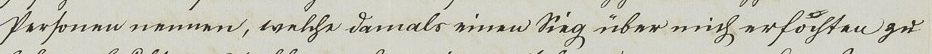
Personen nennen, welche damals einen Sieg über mich erfochten zu
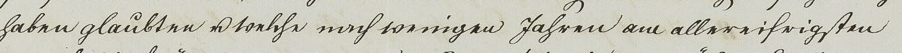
haben glaubten & welche nach wenigen Jahren am allereifrigsten
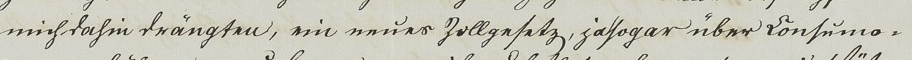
mich dahin drängten, ein neues Zollgesetz, ja sogar über Consumo-
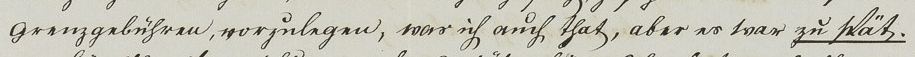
Grenzgebühren, vorzulegen, was ich auch that, aber es war zu spät.
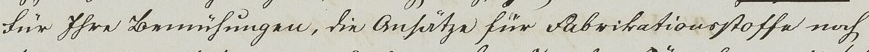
Für Ihre Bemühungen, die Ansätze für Fabrikationsstoffe noch
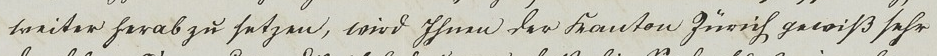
weiter herab zu setzen, wird Ihnen der Kanton Zürich gewiß sehr
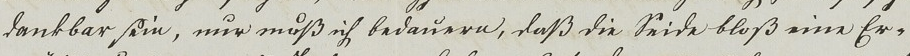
dankbar sein, nur muß ich bedauern, daß die Seide bloß eine Er-
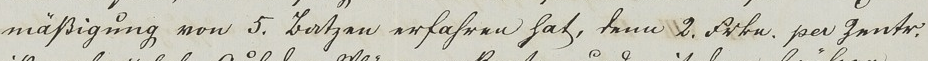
mäßigung von 5. Batzen erfahren hat, denn 2. Frkn. per Zentr.
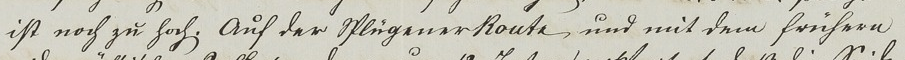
ist noch zu hoch. Auf der Splügener Route und mit dem frühern
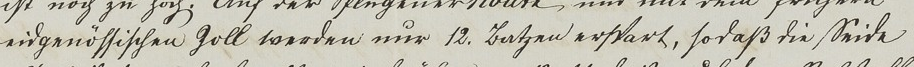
eidgenössischen Zoll werden nur 12. Batzen erspart, so daß die Seide
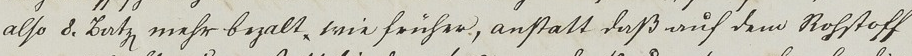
also 8. Batzen mehr bezalt wie früher, anstatt daß auf dem Rohstoff
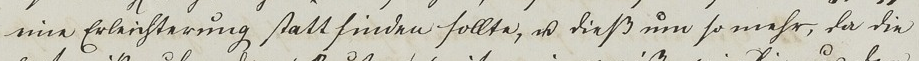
eine Erleichterung statt finden sollte, & dieß um so mehr, da die
